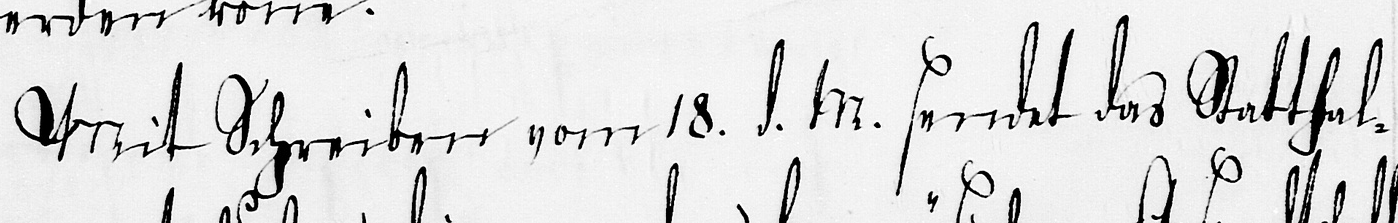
Mit Schreiben vom 18. d. M. sendet das Statthal¬
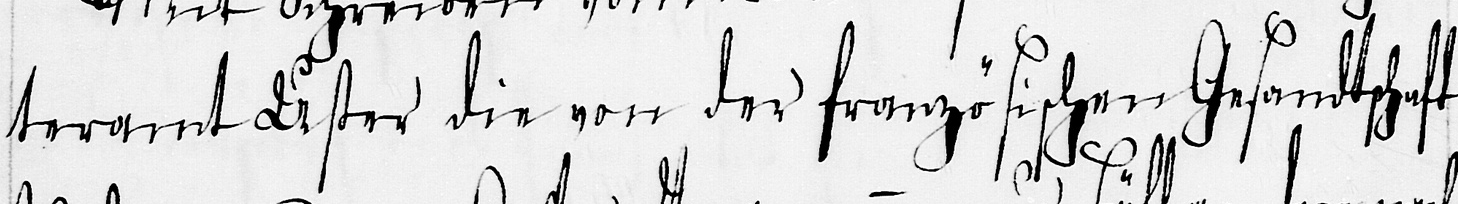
teramt Uster die von der französischen Gesandtschaft
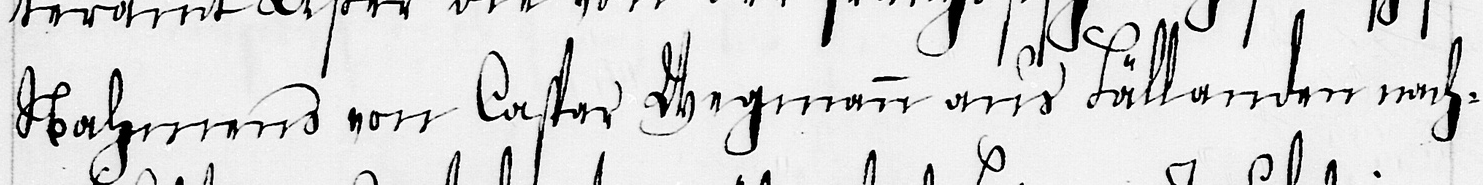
Nahmens von Caspar Wegmann aus Fällanden nach¬
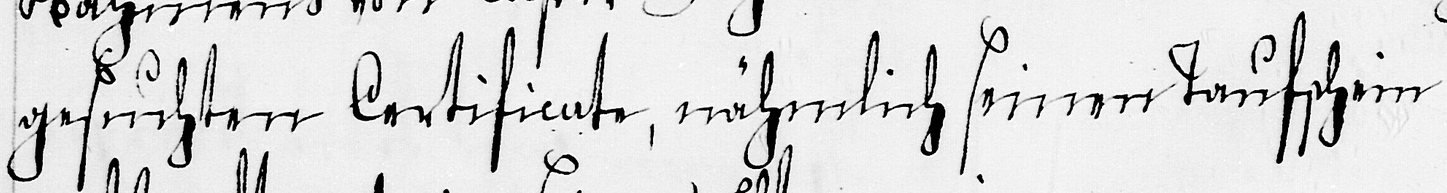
gesuchten Certificate, nähmlich seinen Taufschein
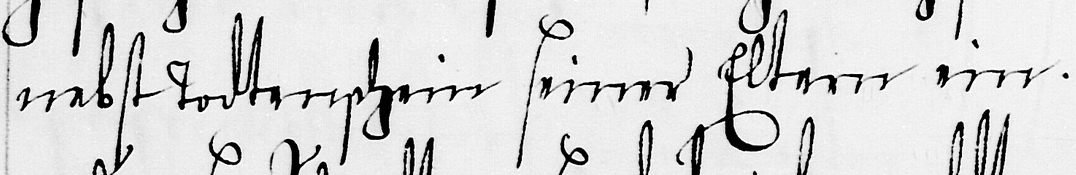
nebst Todtenschein seiner Eltern ein.
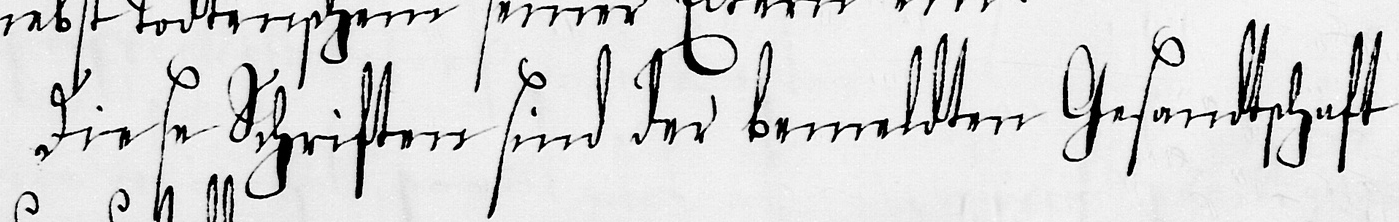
Diese Schriften sind der bemeldten Gesandtschaft
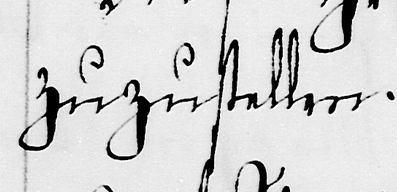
zuzustellen.
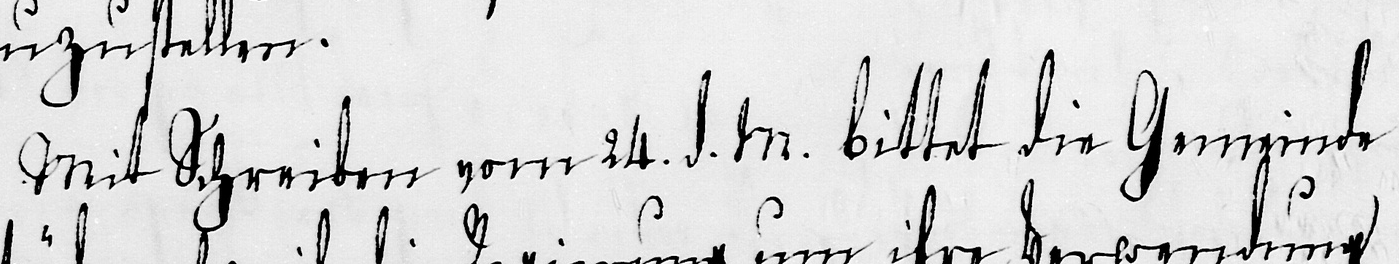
Mit Schreiben vom 24. d. M. bittet die Gemeinde
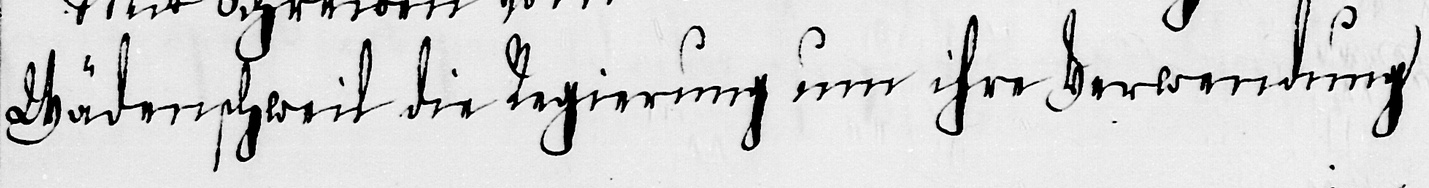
Wädenschweil die Regierung um ihre Verwendung
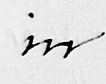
eine
